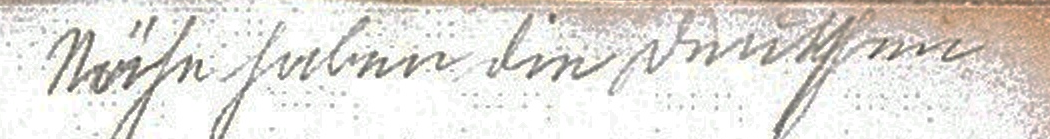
Nähe haben die Deutschen
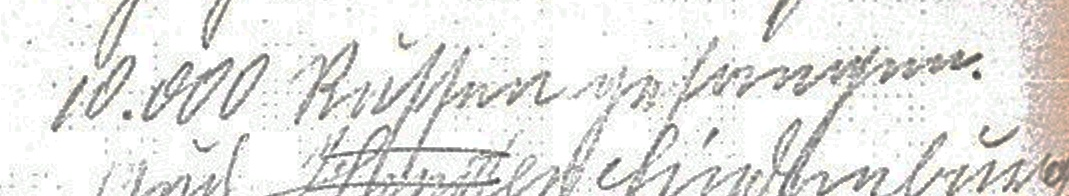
10.000 Russen gefangen.
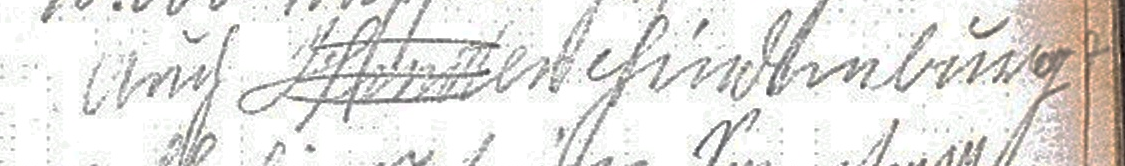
Auch Hindenburg
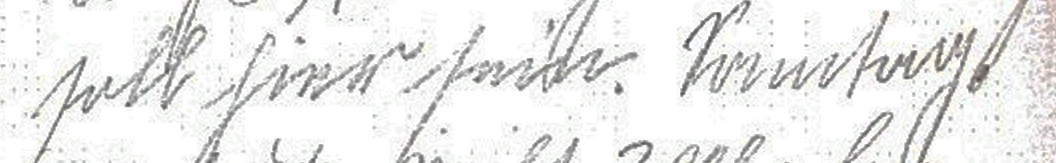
soll hier sein.Sonntag
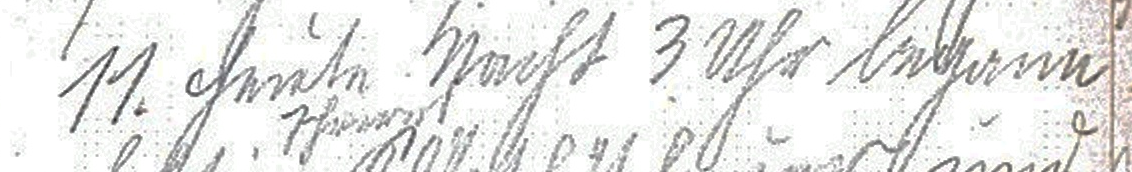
11. heute Nacht 3 Uhr begann
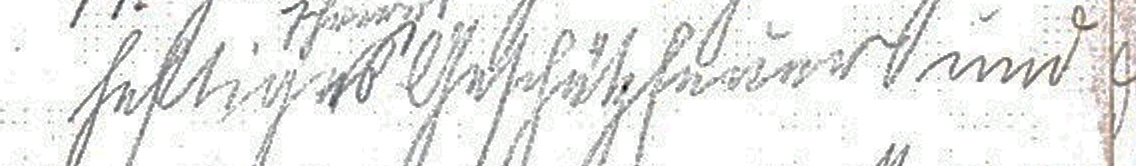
heftiges schweres Geschützfeuer und
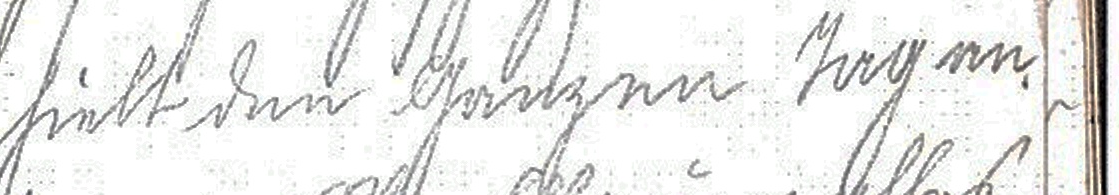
hielt den ganzen Tag an.
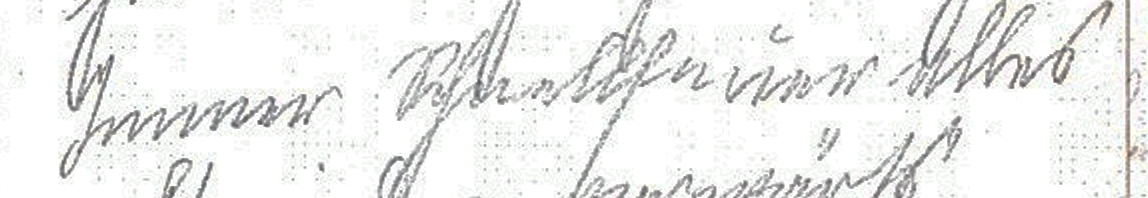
Immer Schnellfeuer alles
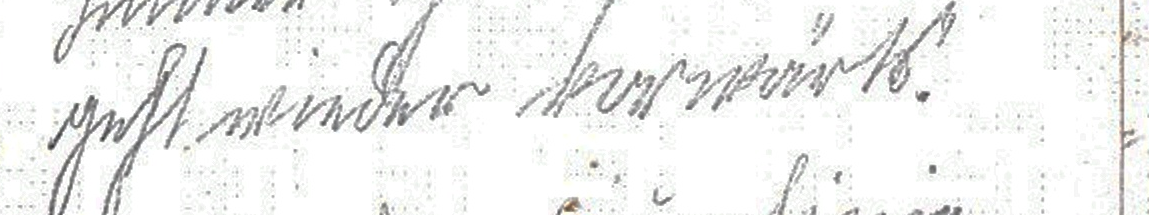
geht wieder vorwärts.
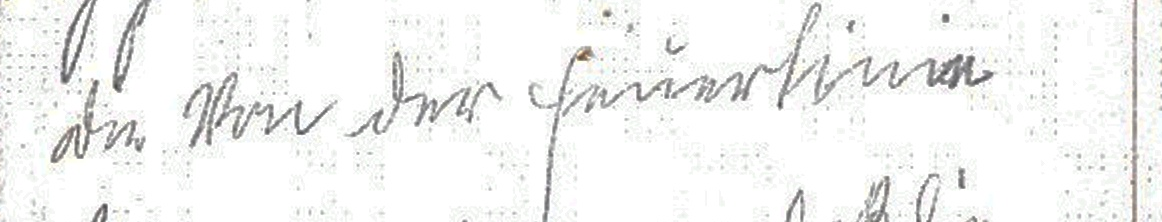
Die von der Feuerlinie
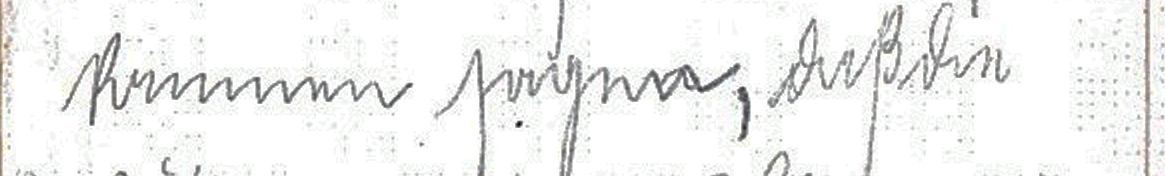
kommen sagen, daß die
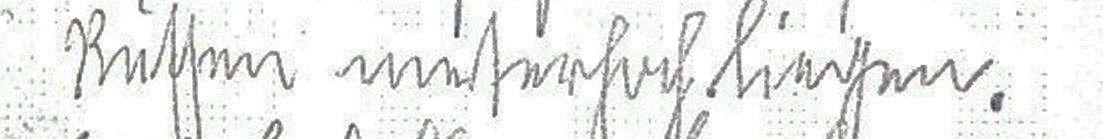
Russen unterhoch ??? liegen.
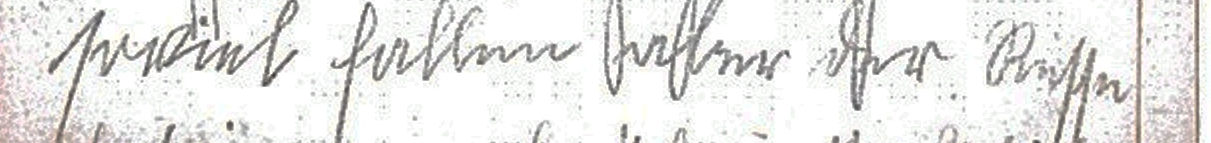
Serviel fallen aber der Russe
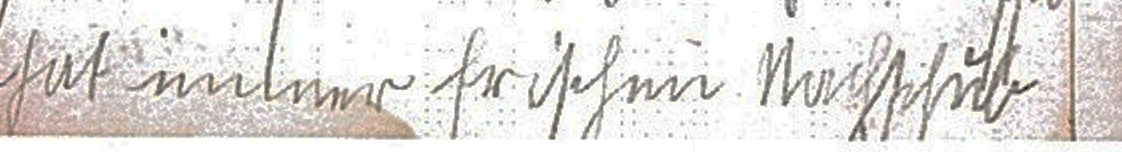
hat immer frischen Nachschub
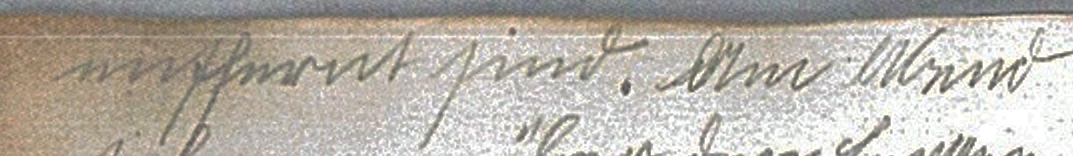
entfernt sind. Am Abend
